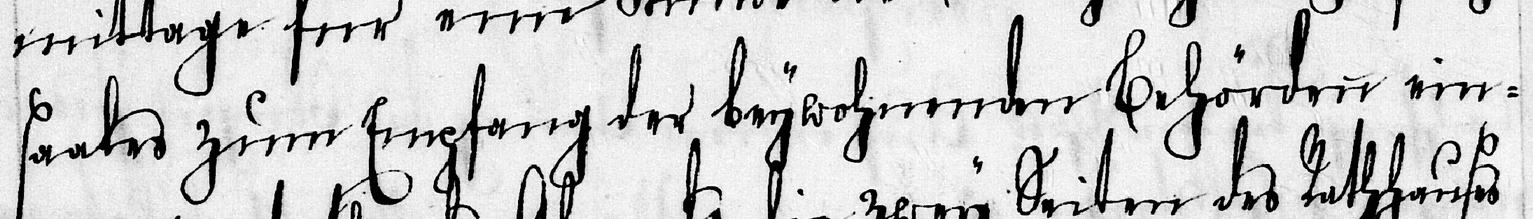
saales zum Empfang der beywohnenden Behörden ein¬
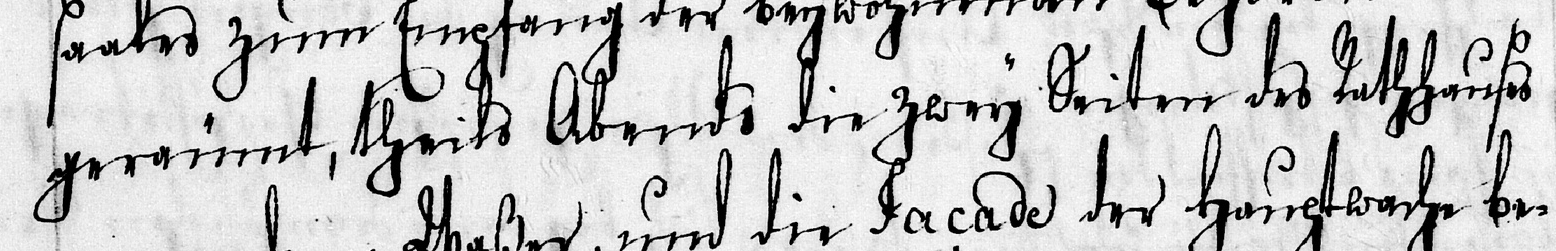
geräumt, theils Abends die zwey Seiten des Rathhauses
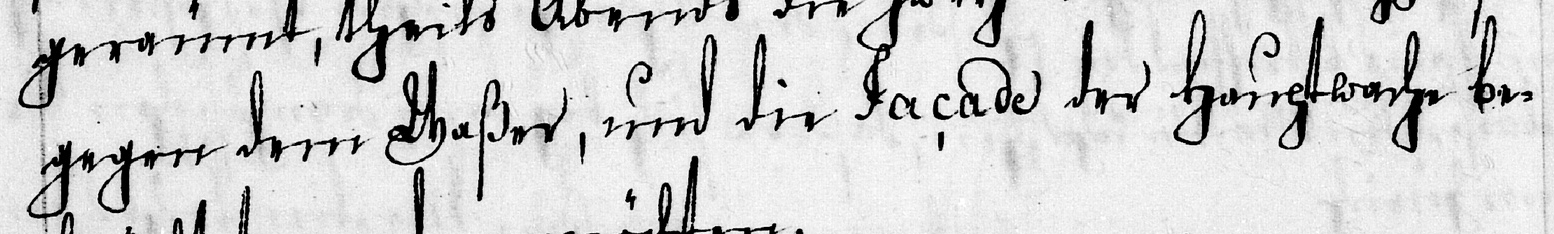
gegen dem Waßer, und die Facade der Hauptwache be¬
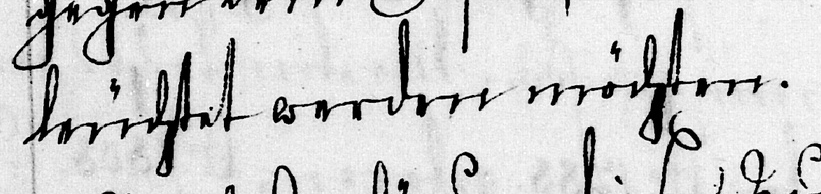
leuchtet werden möchten.
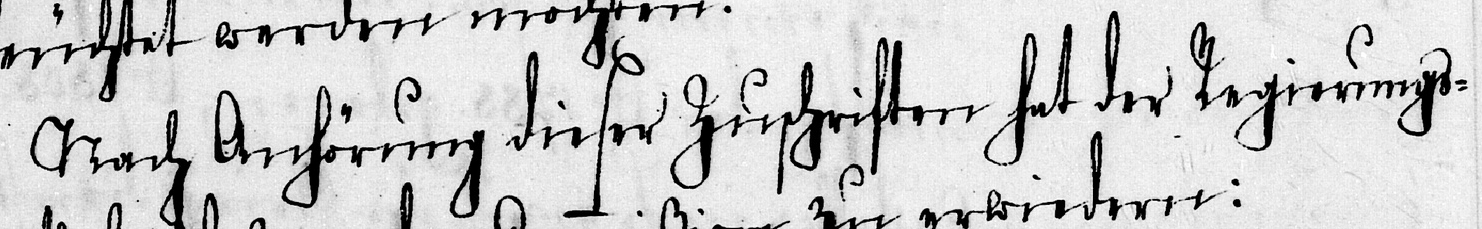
Nach Anhörung dieser Zuschriften hat der Regierungs¬
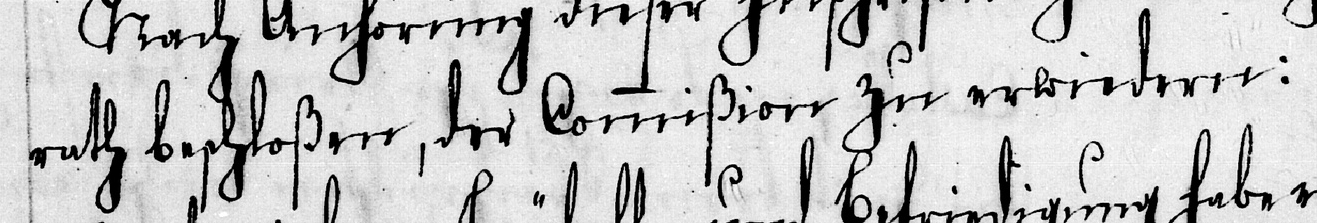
rath beschloßen, der Commißion zu erwiedern:
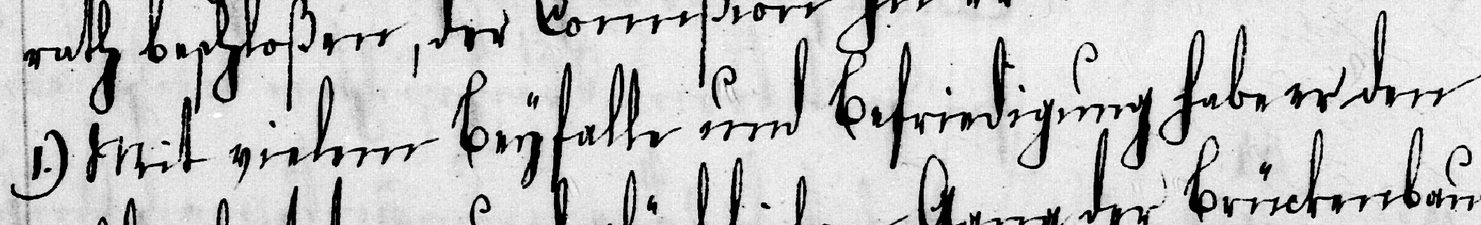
1.) Mit vielem Beyfalle und Befriedigung habe er den
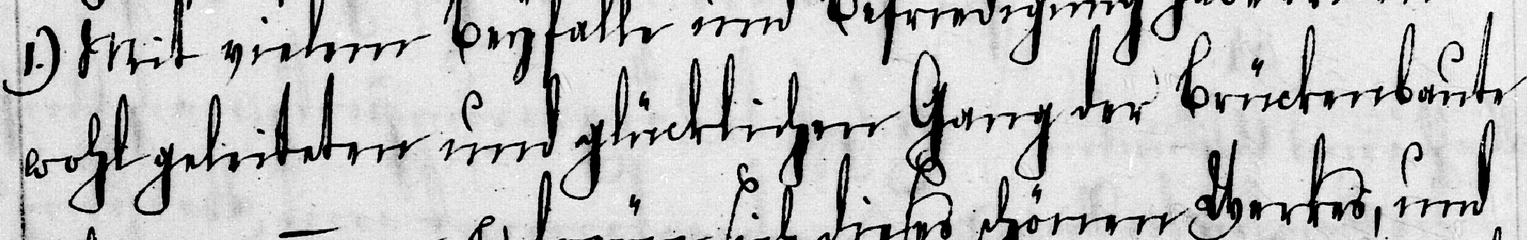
wohl geleiteten und glücklichen Gang der Brückenbaute
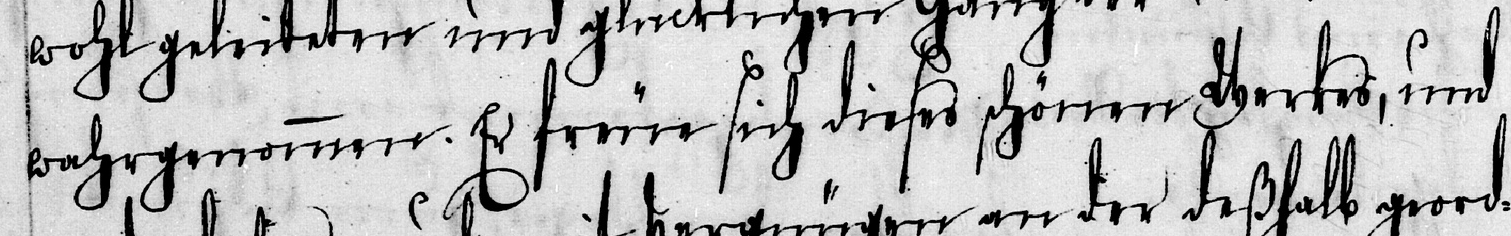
wahrgenommen. Er freue sich dieses schönen Werkes, und
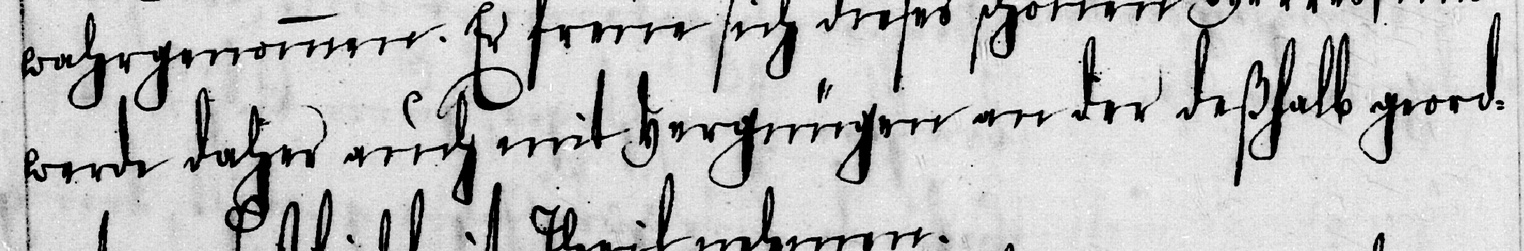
werde daher auch mit Vergnügen an der deßhalb geord¬
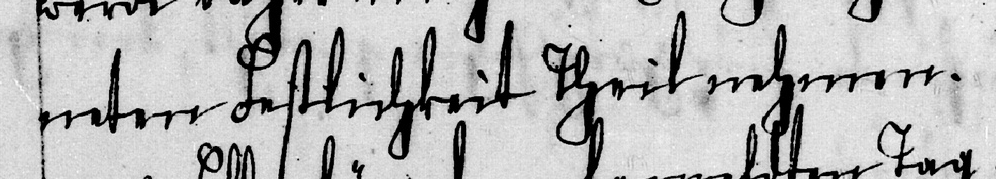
neten Festlichkeit Theil nehmen.
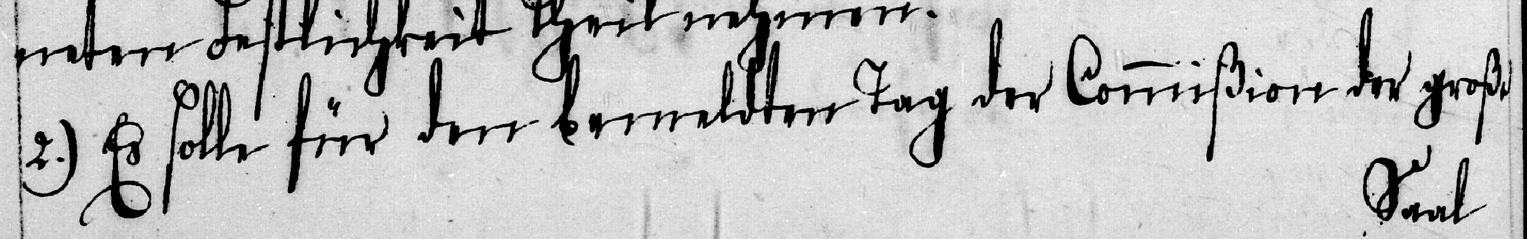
2.) Es solle für den bemeldten Tag der Commißion der große
